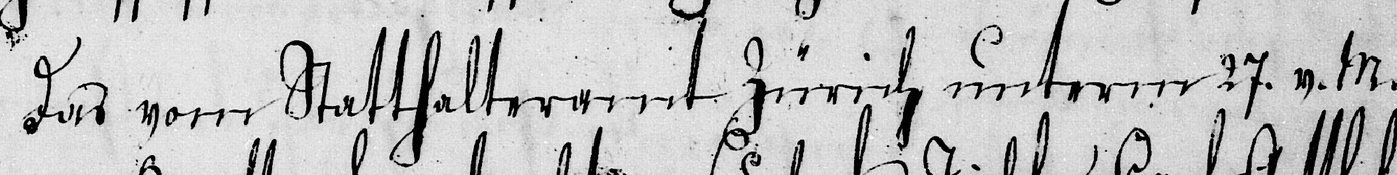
Das vom Statthalteramt Zürich unterm 27. v. M.
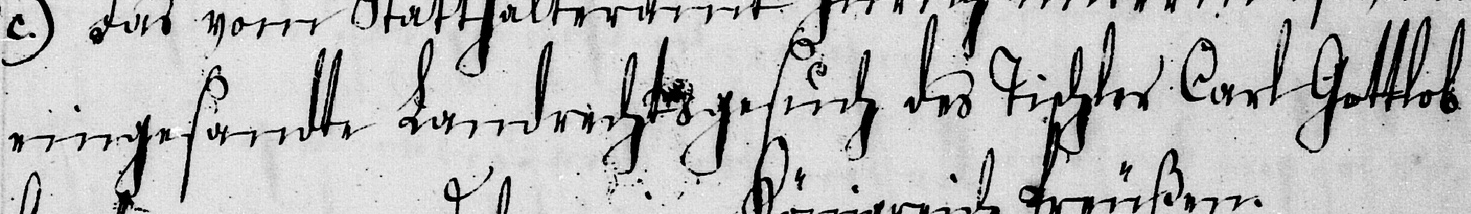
eingesandte Landrechtsgesuch des Fischer Carl Gottlob
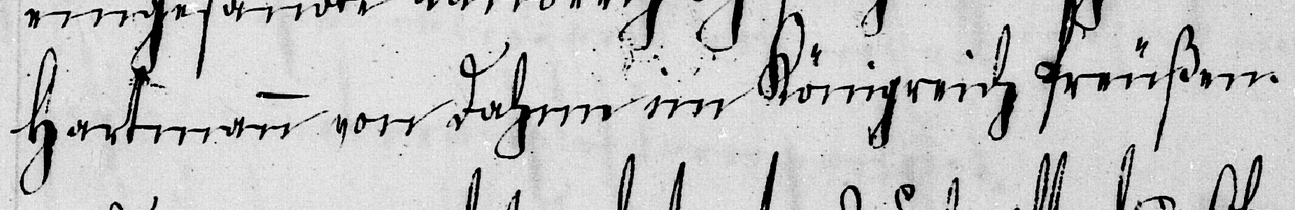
Hartmann von Dahme im Königreich Preußen.
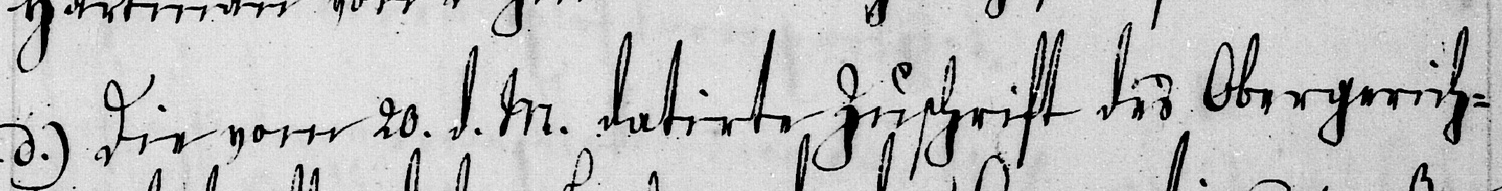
d.) Die vom 20. d. M. datirte Zuschrift des Obergerich¬
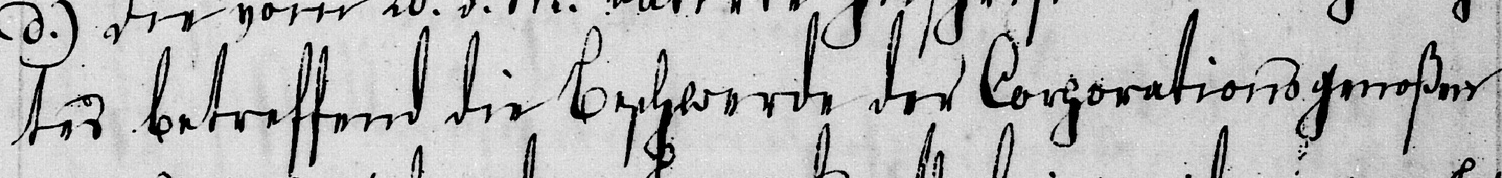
tes betreffend die Beschwerde der Corporationsgenoßen
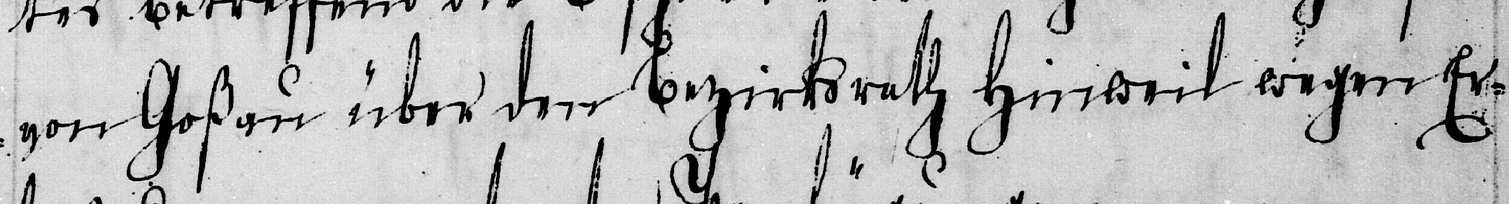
von Goßau über den Bezirksrath Hinweil wegen Er¬
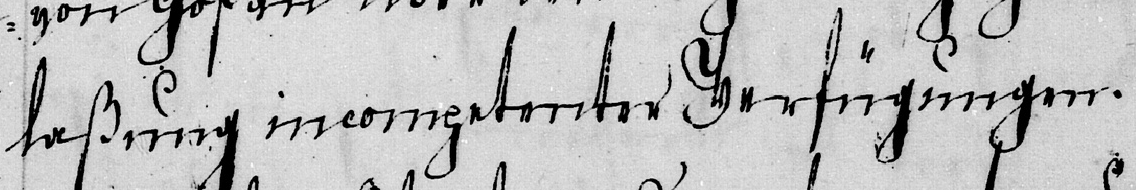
laßung incompetenter Verfügungen.
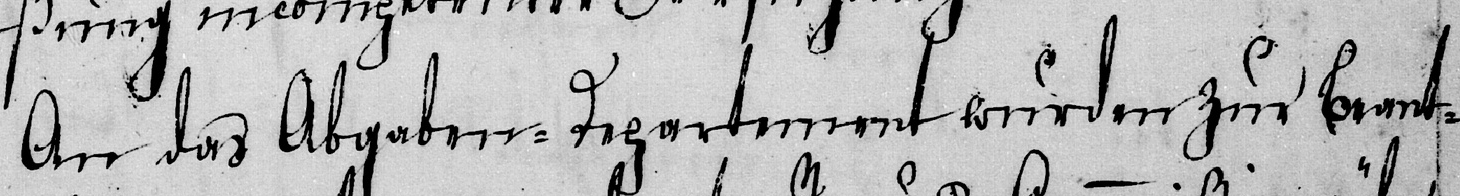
An das Abgaben-Departement wurde zur Beant¬
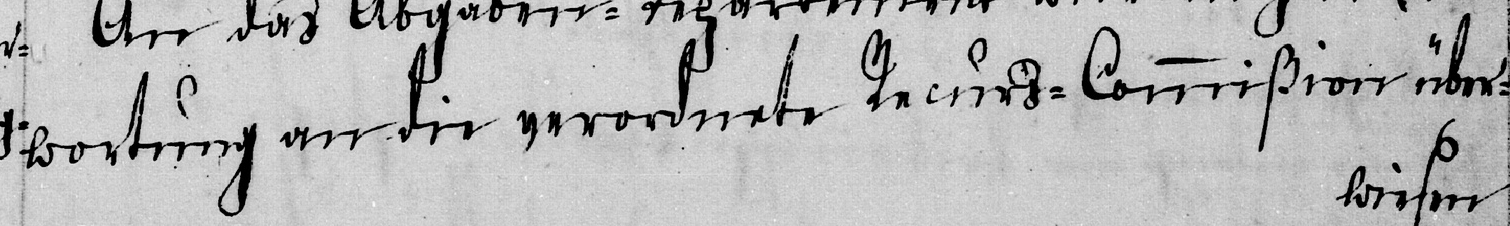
wortung an die verordnete Recurs-Commißion über-
